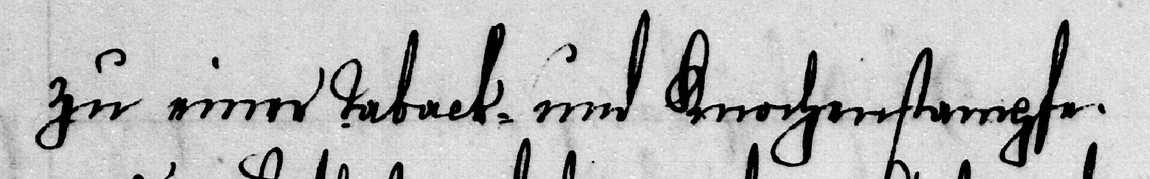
zu einer Taback- und Knochenstampfe.
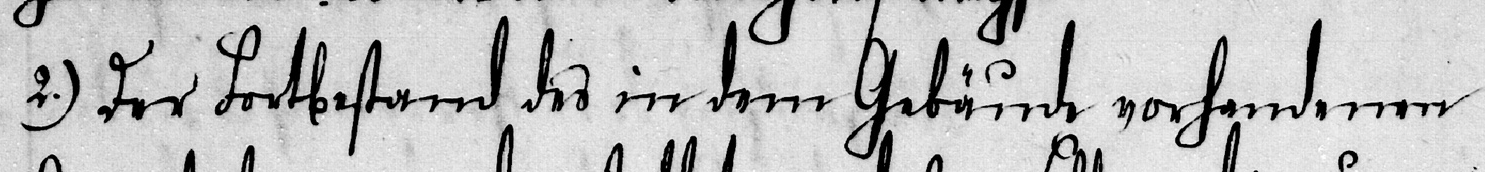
2.) Der Fortbestand des in dem Gebäude vorhandenen
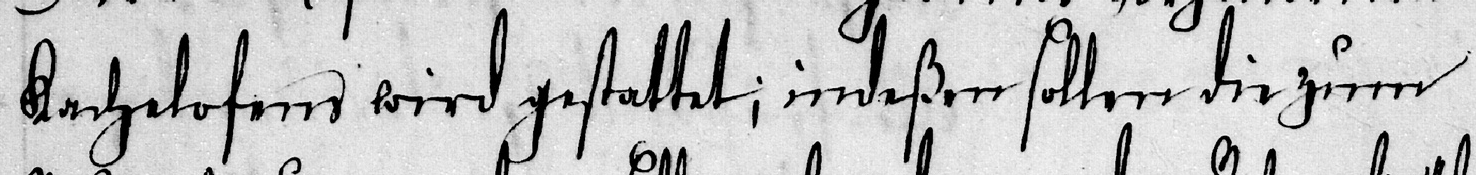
Kachelofens wird gestattet; indeßen sollen die zum
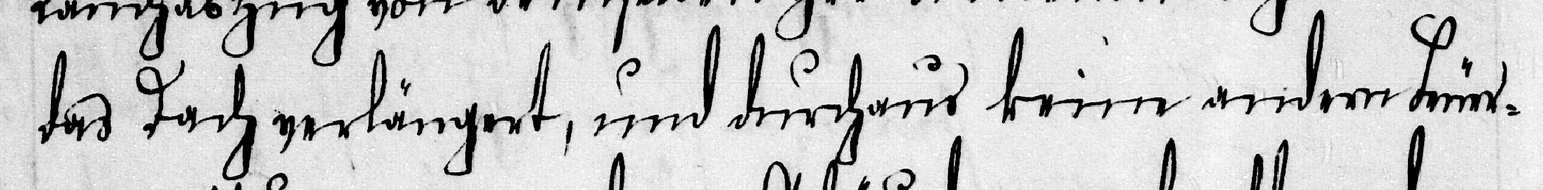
das Dach verlängert, und durchaus keine andern Feuer¬
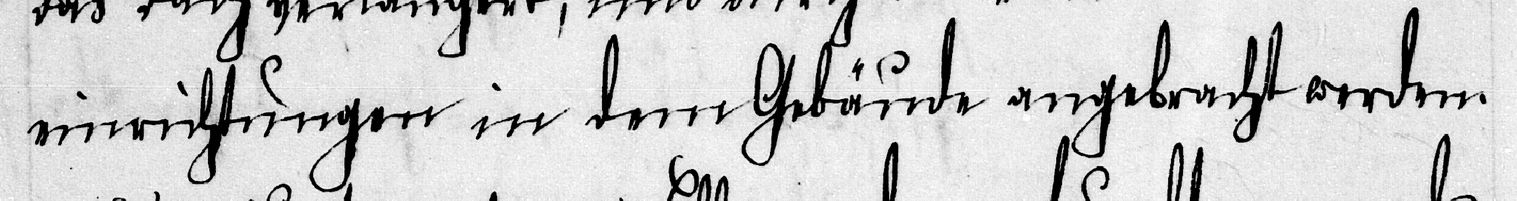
einrichtungen in dem Gebäude angebracht werden.
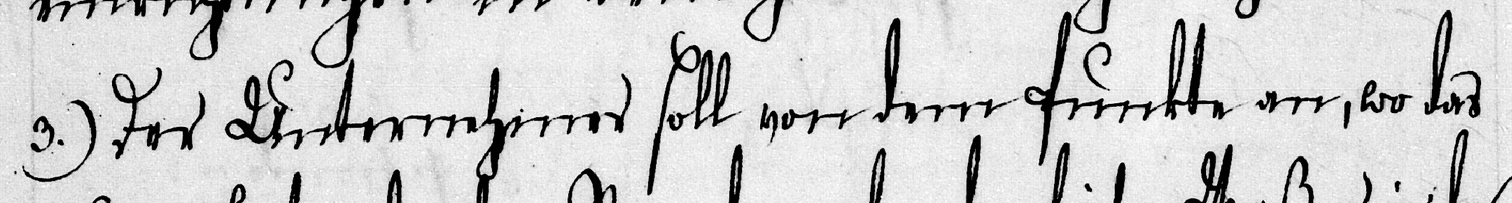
3.) Der Unternehmer soll von dem Punkte an, wo das
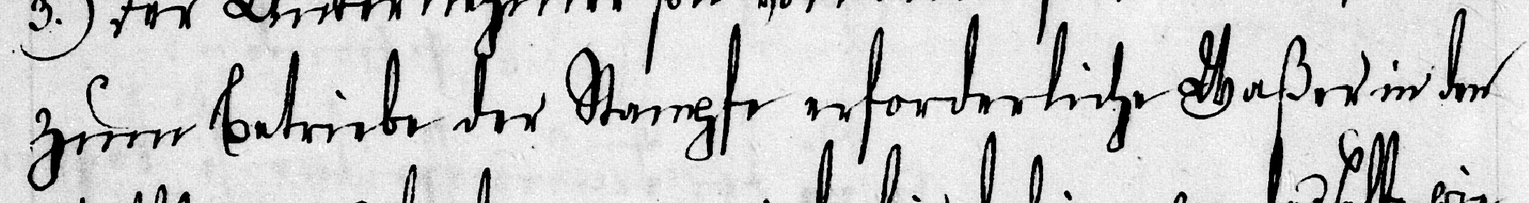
zum Betriebe der Stampfe erforderliche Waßer in den
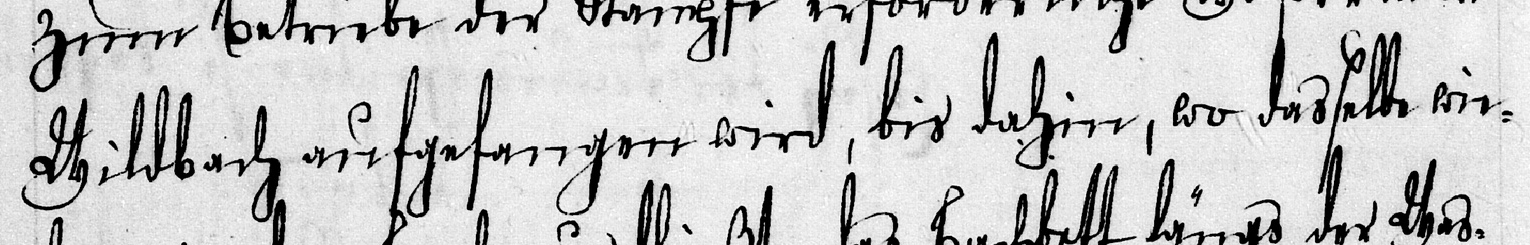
Wildbach aufgefangen wird, bis dahin, wo dasselbe
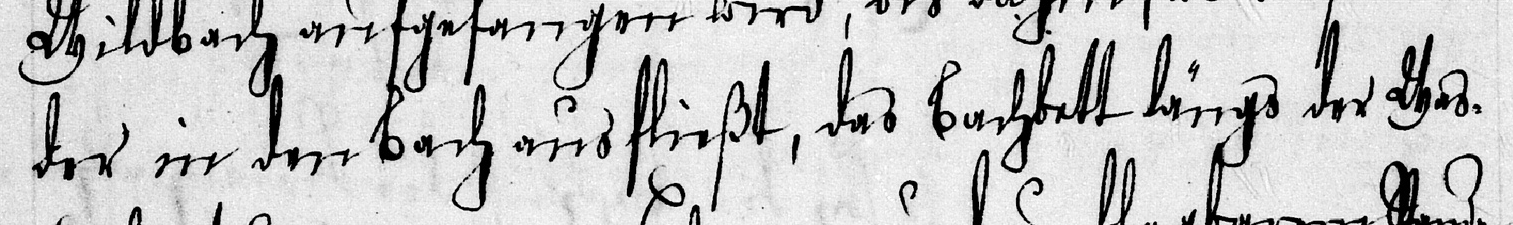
der in den Bach ausfließt, das Bachbett längs der Waß¬
